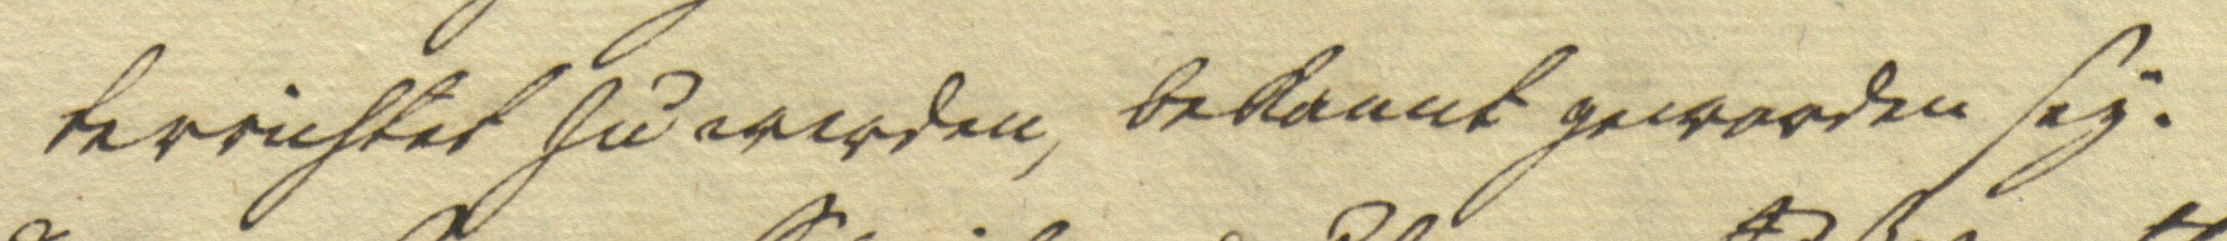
terrichtet zu werden, bekannt geworden seÿ.
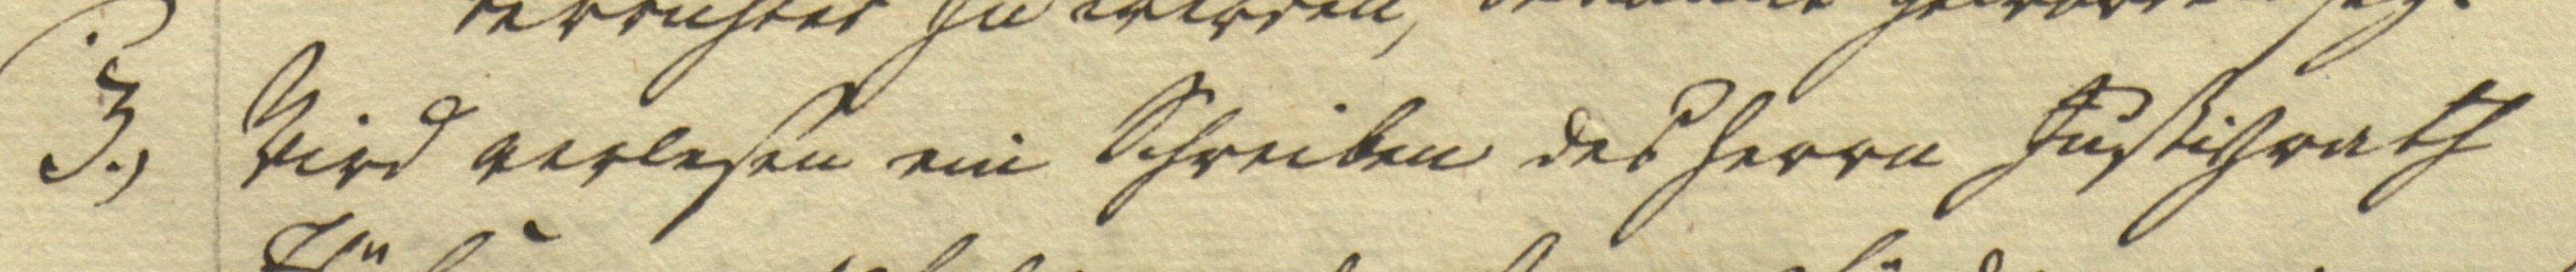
3., Wird verlesen ein Schreiben des Herrn Justizrath
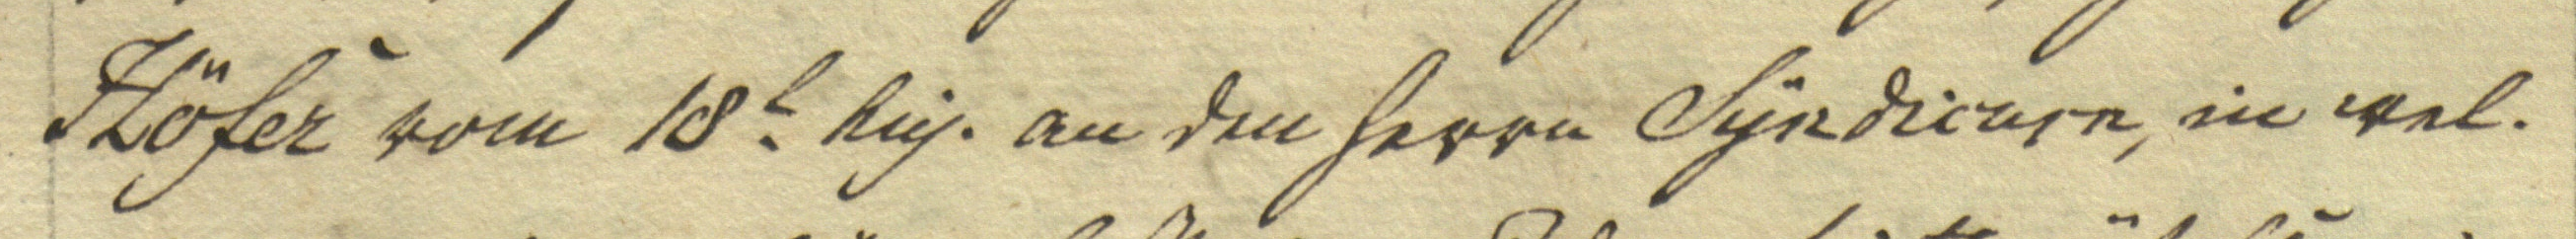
Höfer vom 18. huj. an den Herrn Sÿndicum, in wel¬
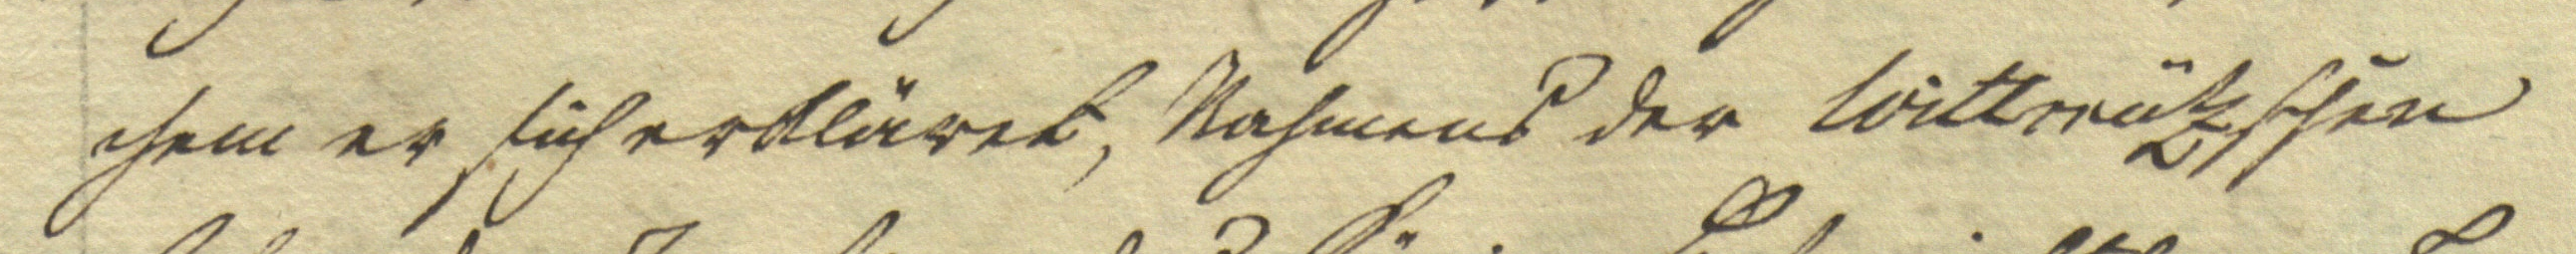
chem er sich erkläret, Nahmens der Wittmützschen
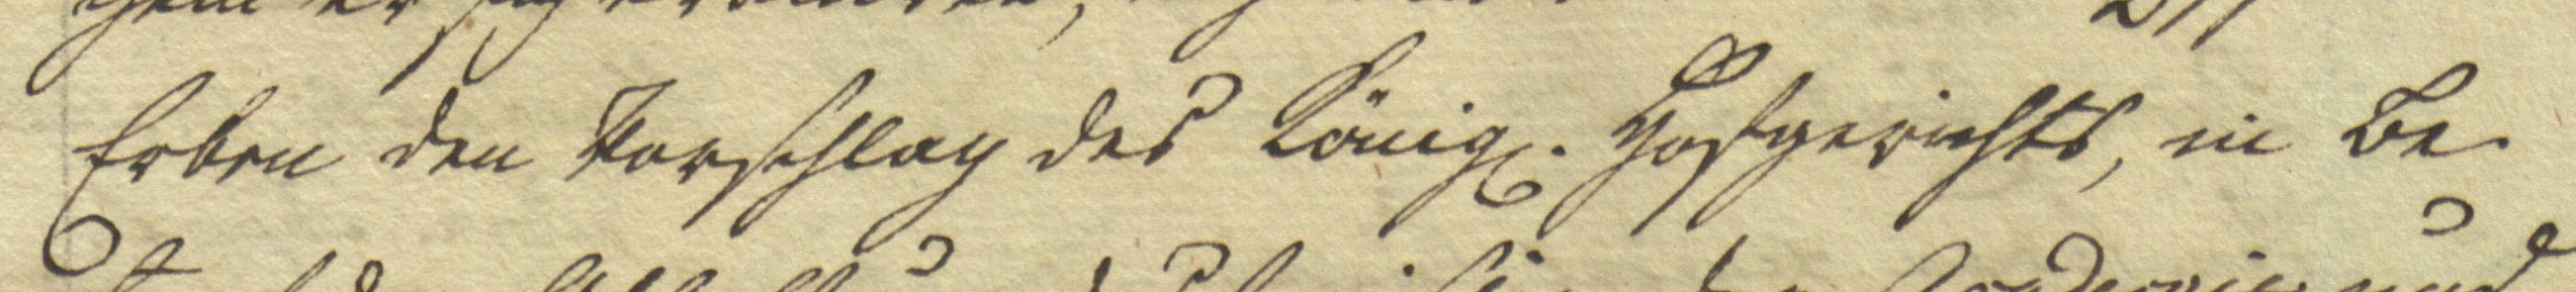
Erben den Vorschlag des Königl. Hofgerichts in Be¬
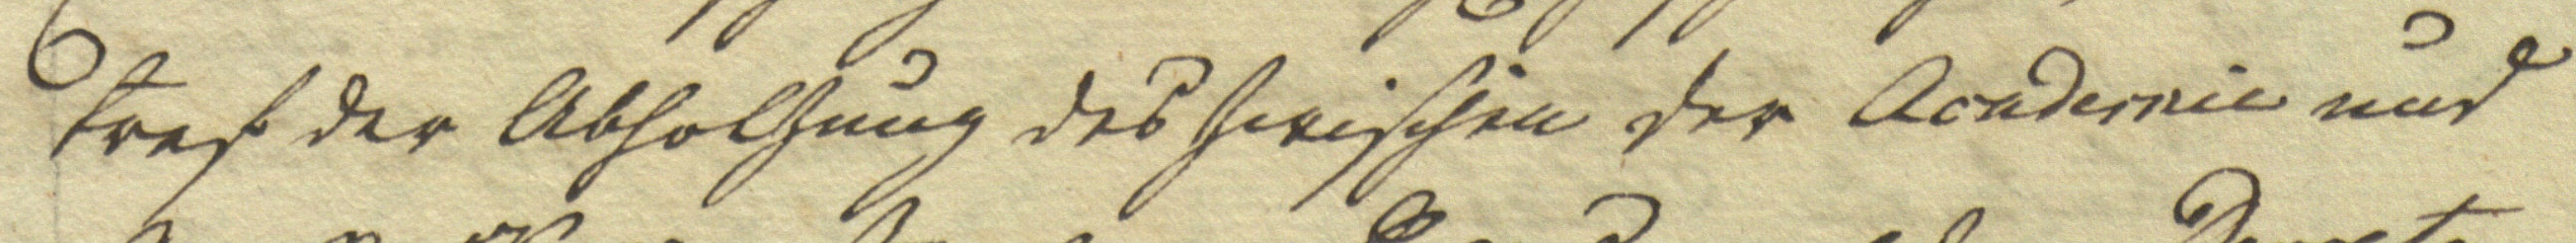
tref der Abholzung des zwischen der Academie und
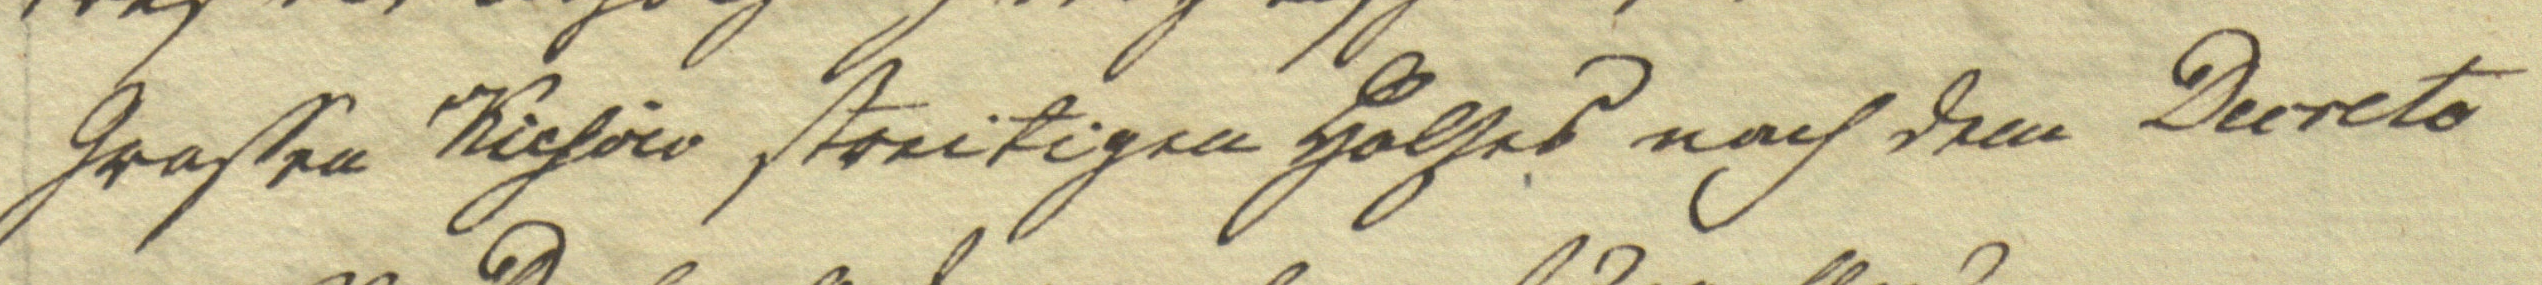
Grossen Kiesow streitigen Holzes nach dem Decreto
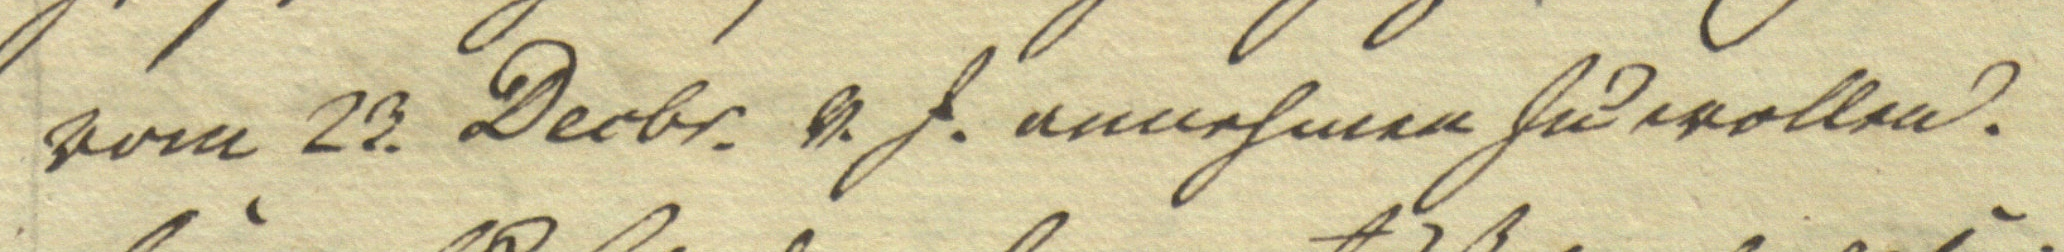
vom 23. Decbr. v. J. annehmen zu wollen.
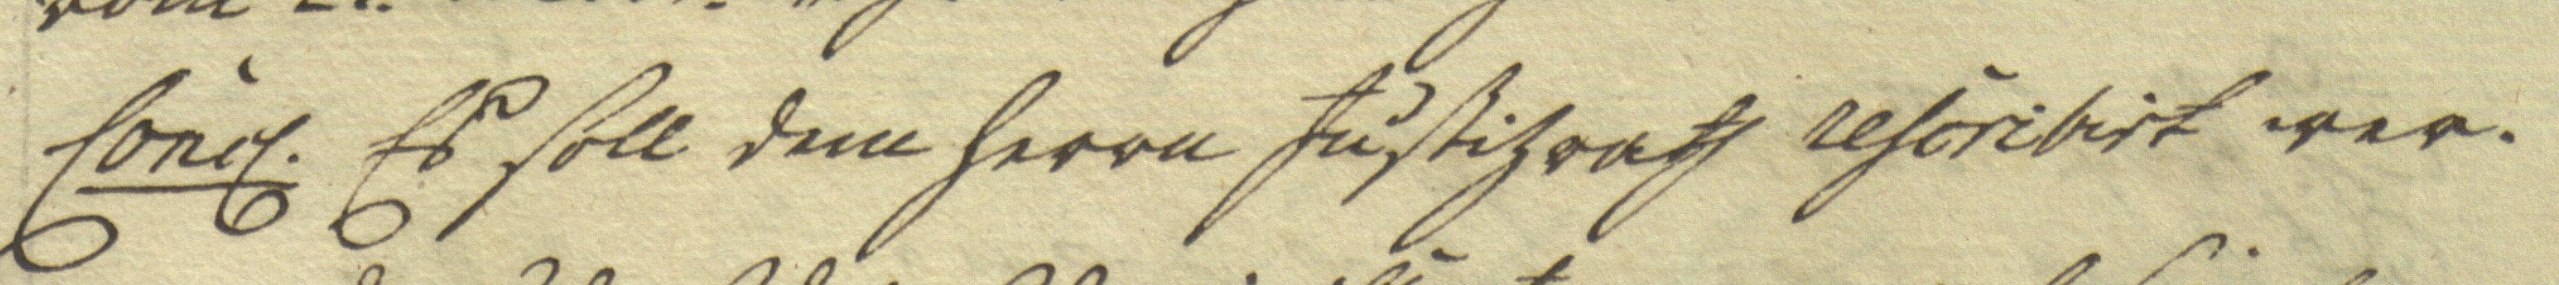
Concl. Es soll dem Herrn Justizrath rescribirt wer¬
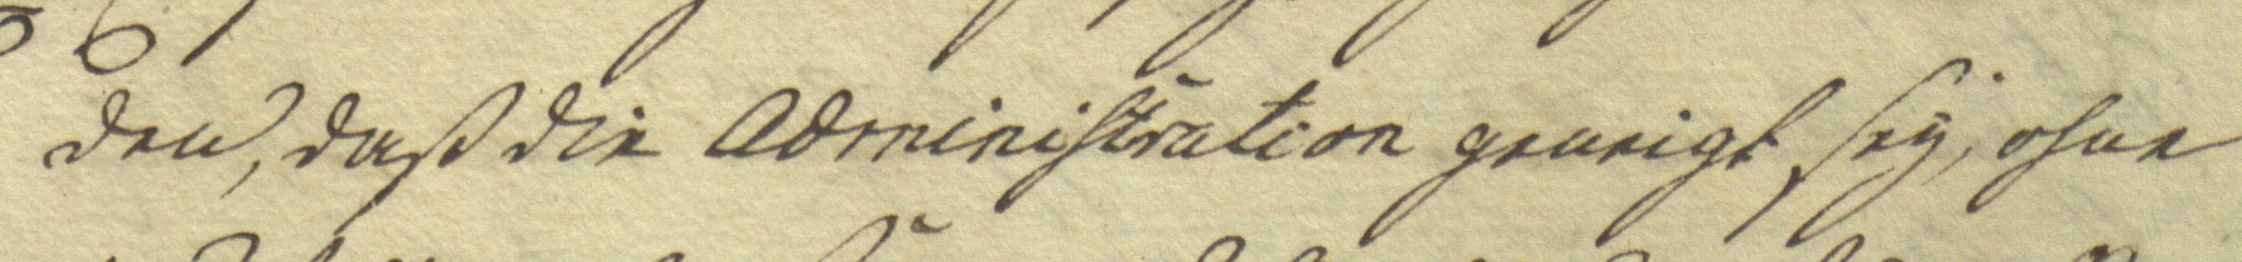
den, daß die Administration geneigt seÿ, ohne
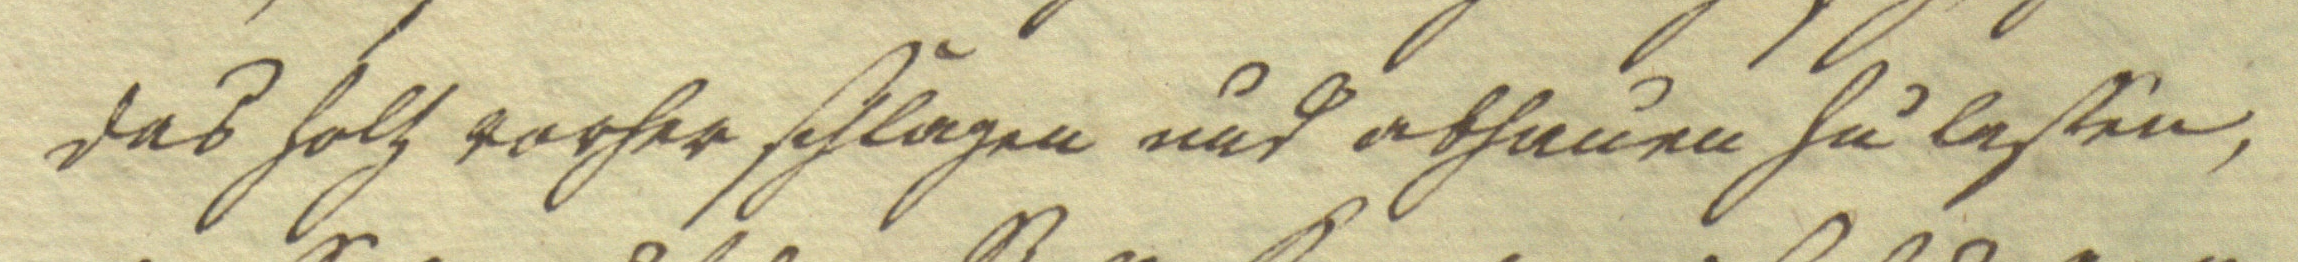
das Holz vorher schlagen und abhauen zu lassen,
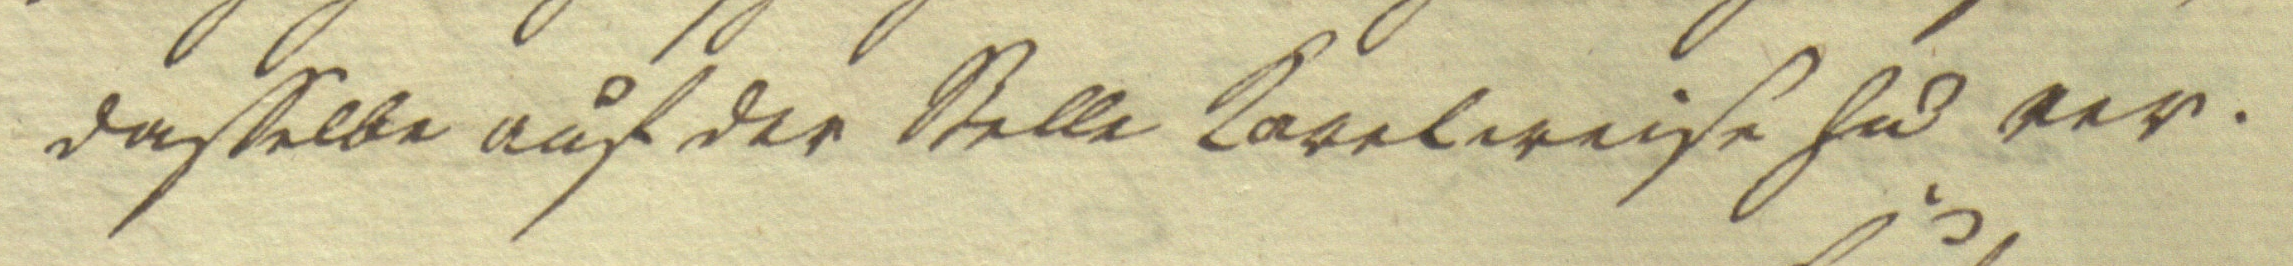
dasselbe auf der Stelle Kavelweise zu ver¬
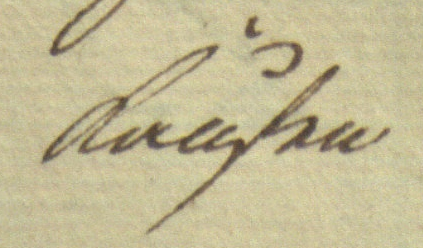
kaufen.
